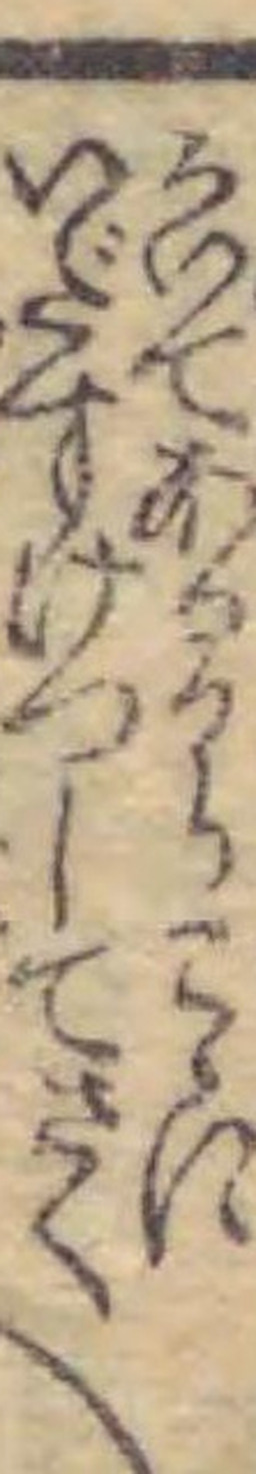いだすけつしてさく
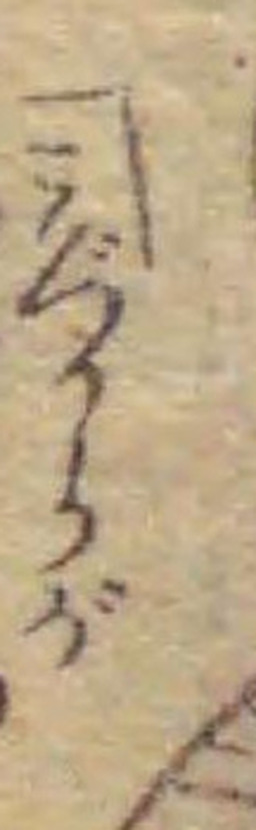〽みづからが
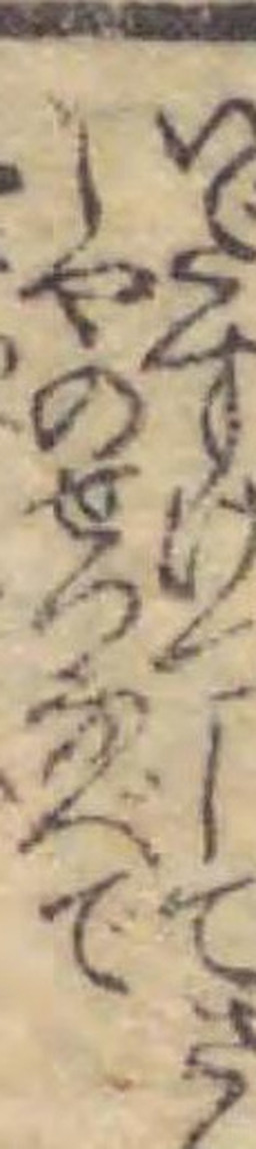しやのせつなべで
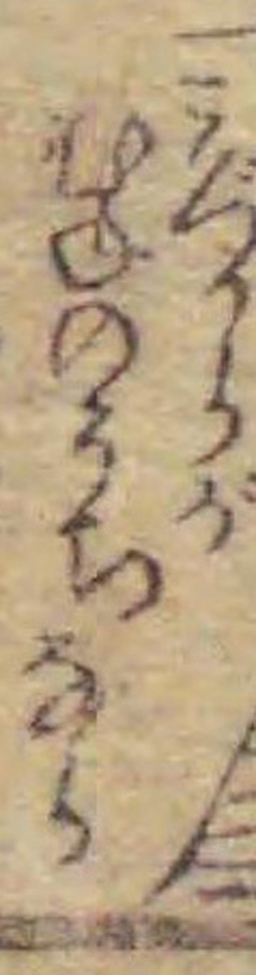むねのうちなら
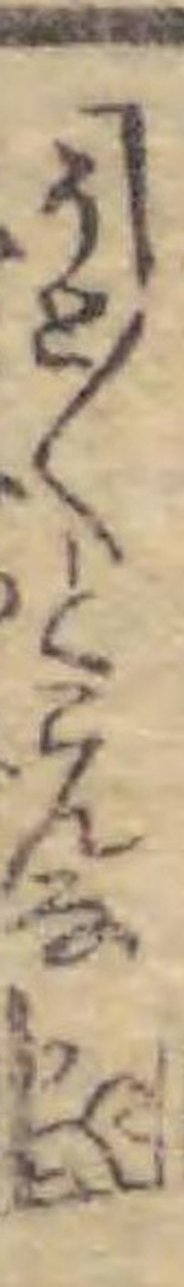〽うと〳〵とこんな
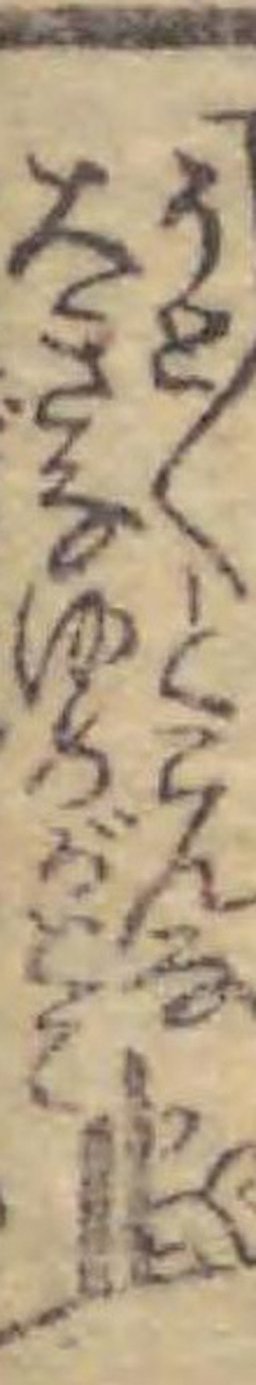大きなゆめがここ
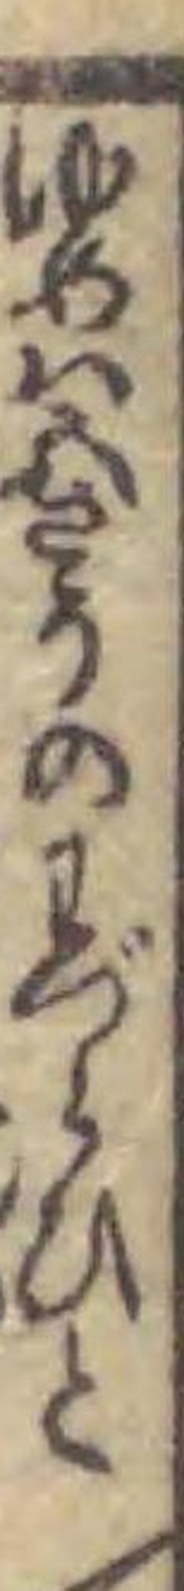ゆめは五さうのわづらひと
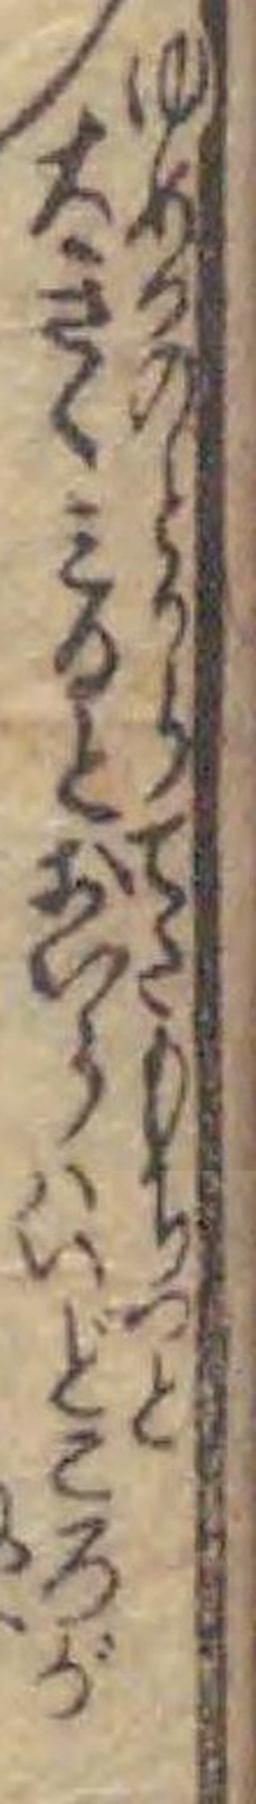大きくみるとおいらはいどころが
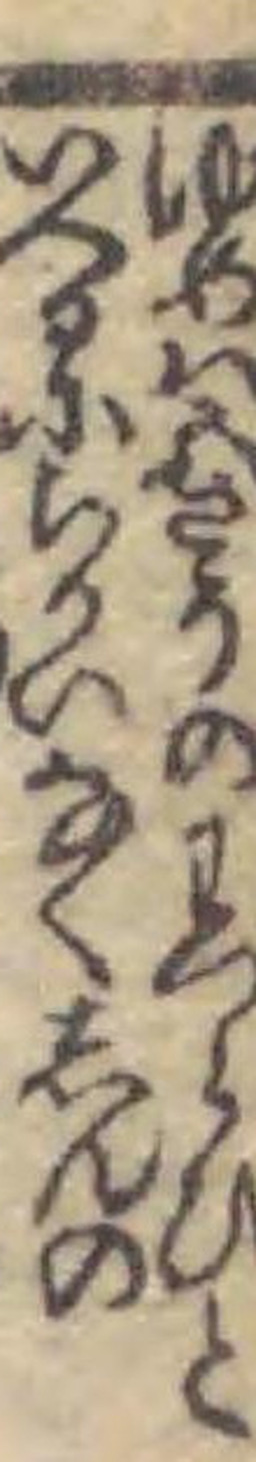いへるにちかいなくしんの
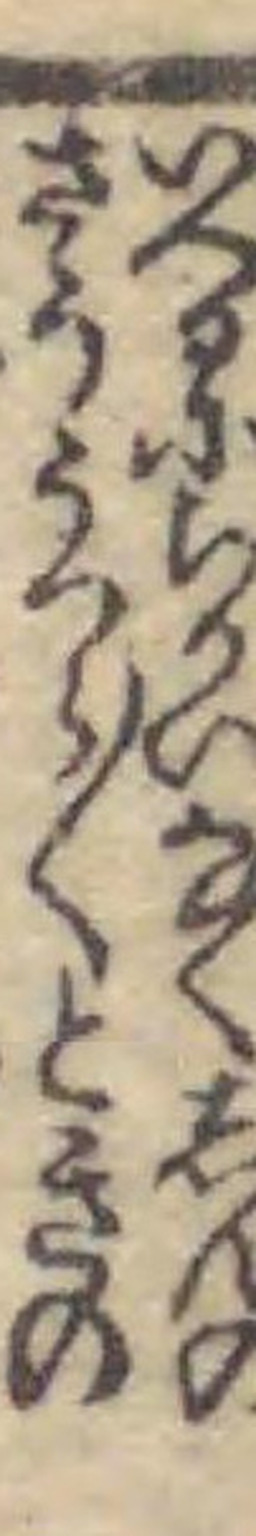さううつら〳〵ときの
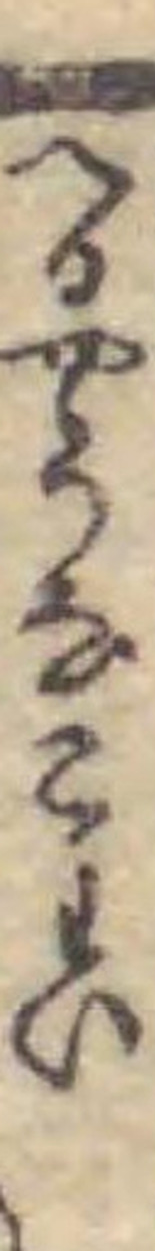へるやうなこわい
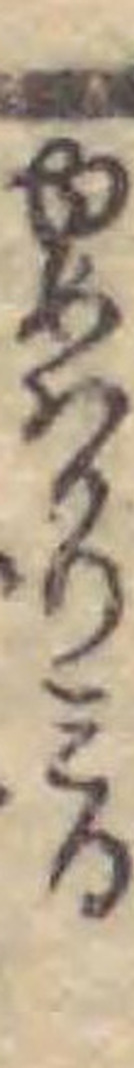ゆめはかりみる
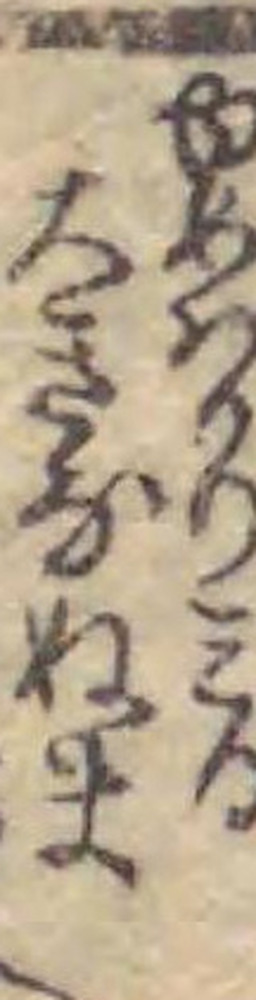大きなぬま
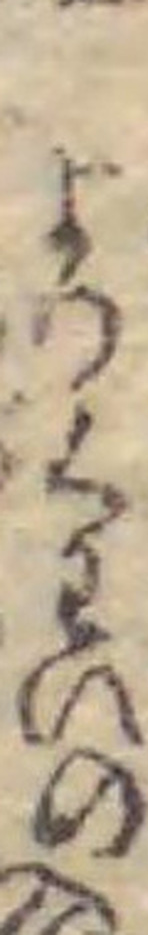よりくわいの
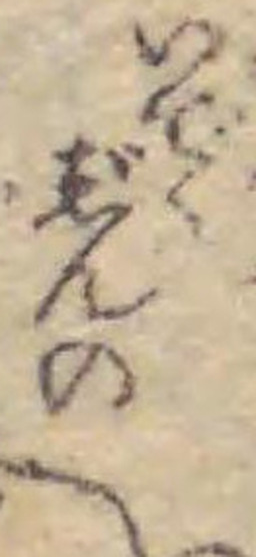じんの
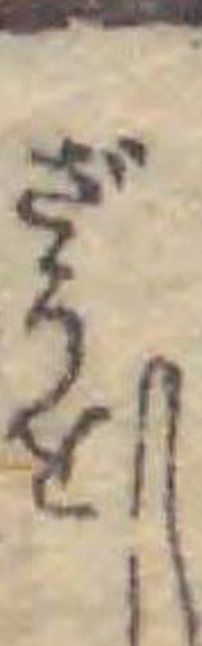ざうを
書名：十四傾城腹之内 : 3巻
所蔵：国立国会図書館 National Diet Library, JAPAN
